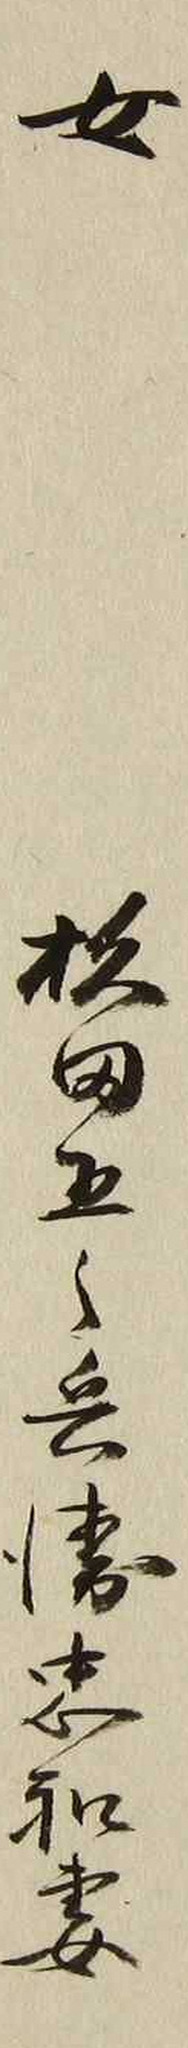女杉田五郎兵衛忠和妻
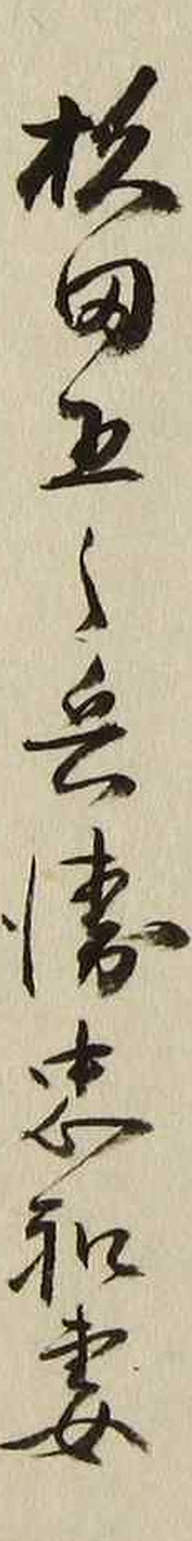女杉田五郎兵衛忠和妻
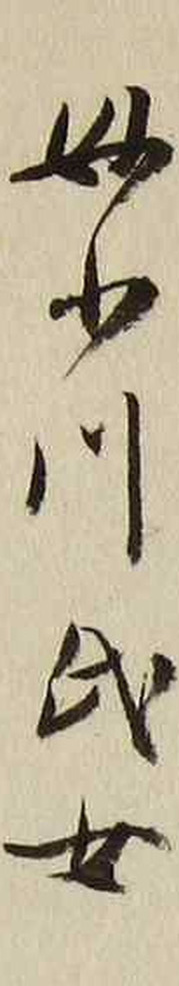母小川氏女

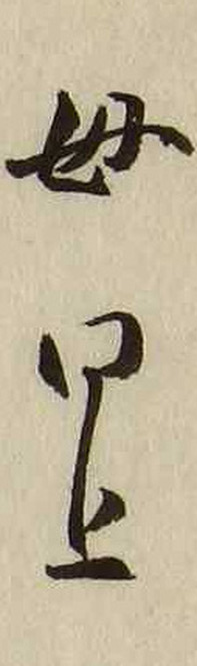母同上
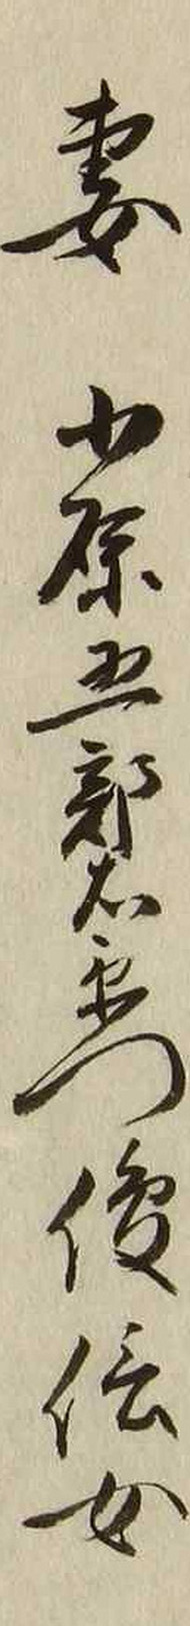妻小原五郎右衛門俊信女
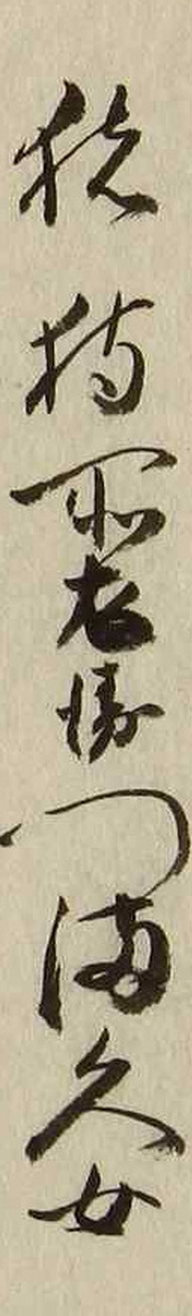猪狩所左衛門満久女
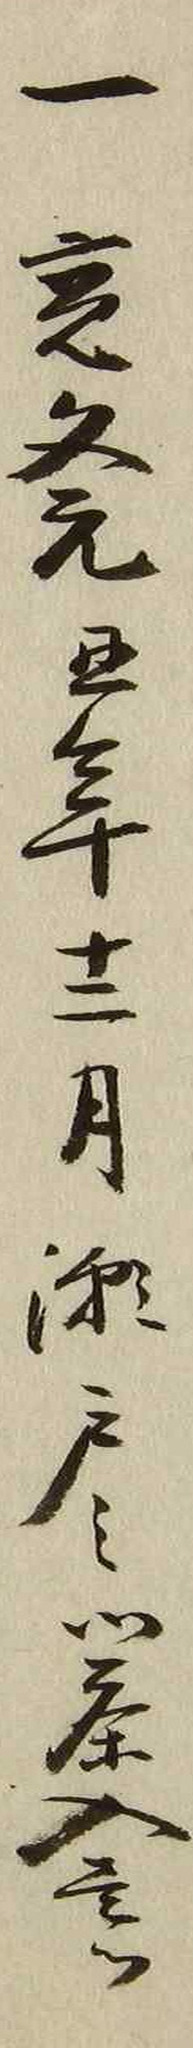一寛文元丑年十二月瀬戸之御茶入壱つ
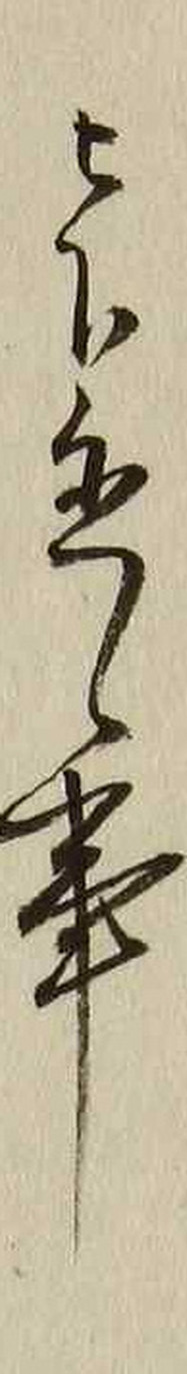被下置候事
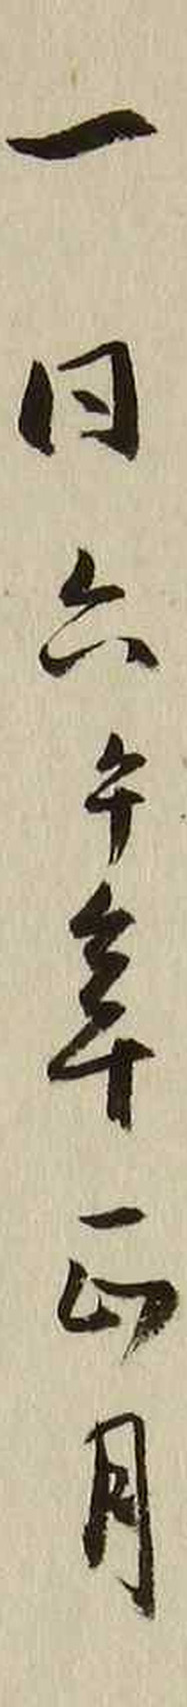一同六午年正月
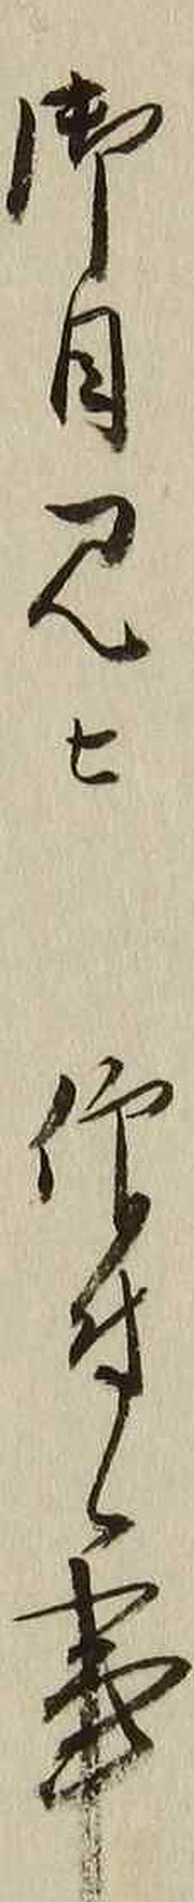御目見被仰付候事
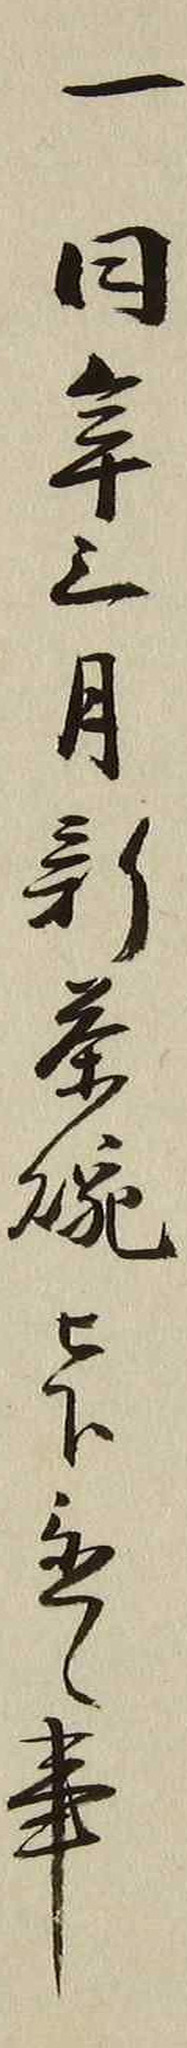一同年三月新茶碗被下置候事
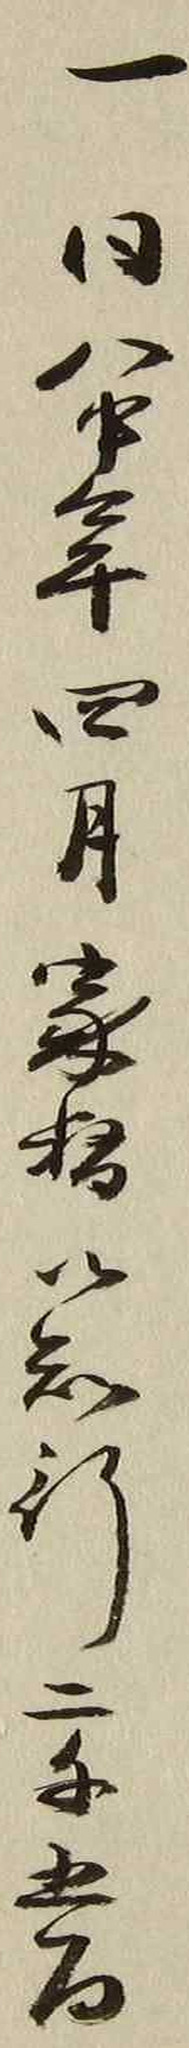一同八申年四月家督御知行弐千五百
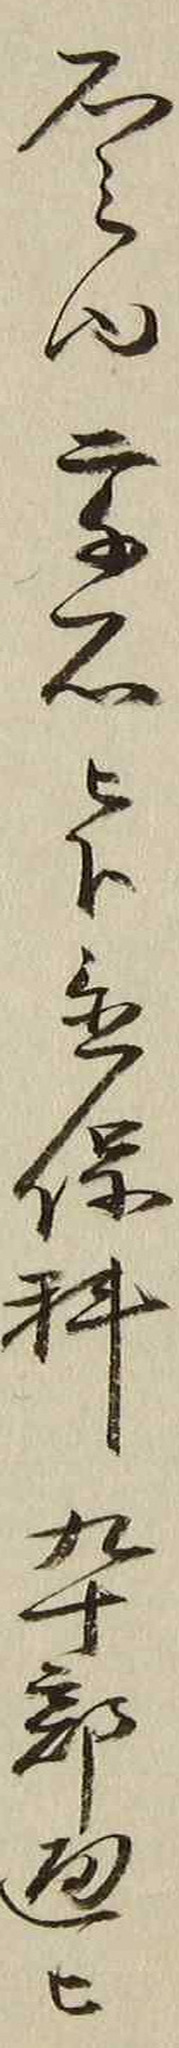石之内二千石被下置保科九十郎通被
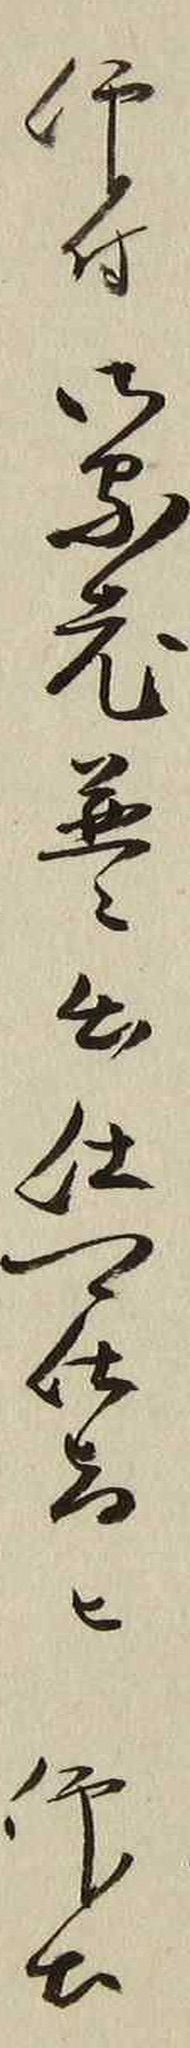仰付御家老並に出仕可仕旨被仰出
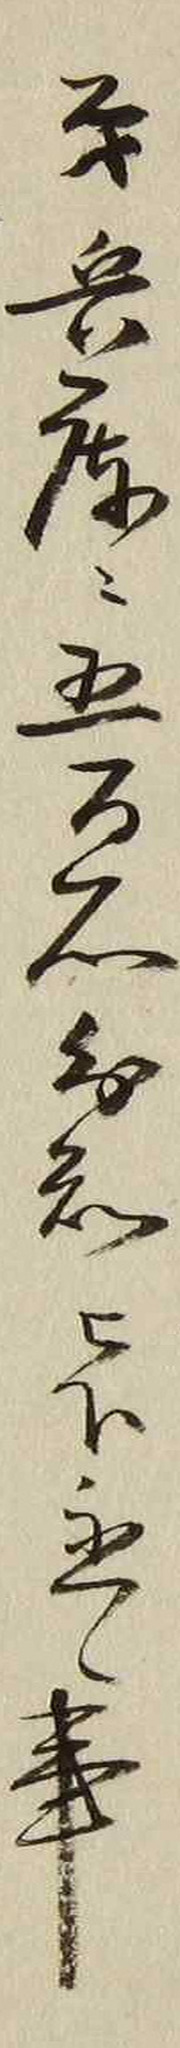弟兵庫に五百石分知被下置候事
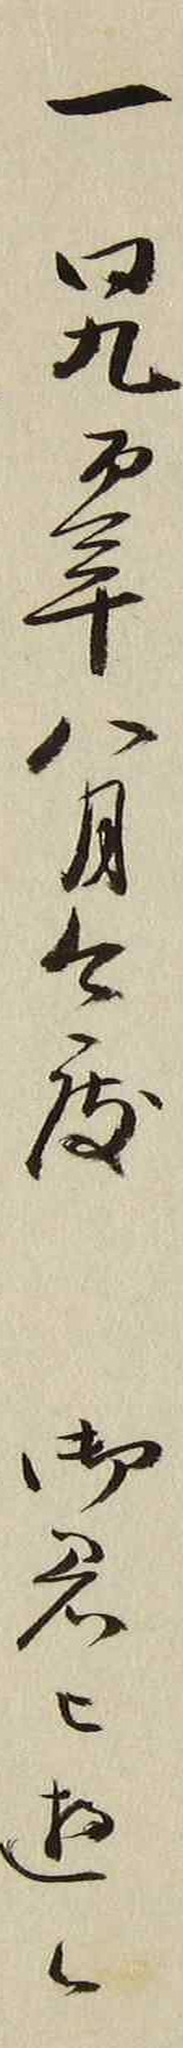一同九酉年八月今度御着被遊候
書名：諸士系譜　巻之292　き之部1
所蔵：会津若松市立会津図書館
